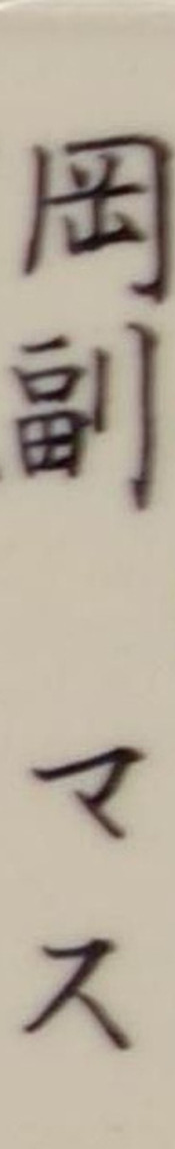岡副マス
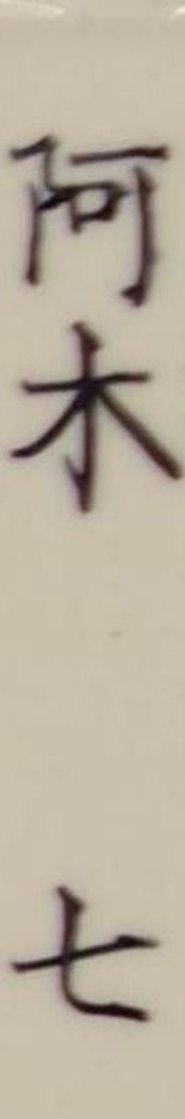阿木七
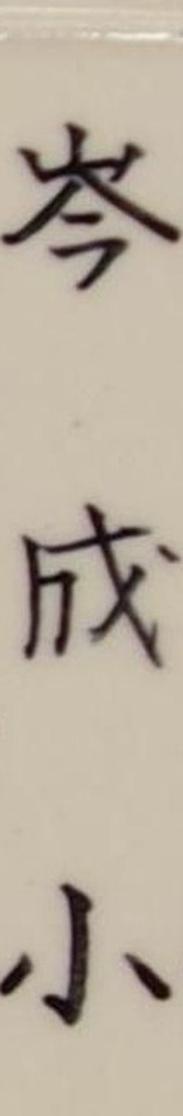岑成小
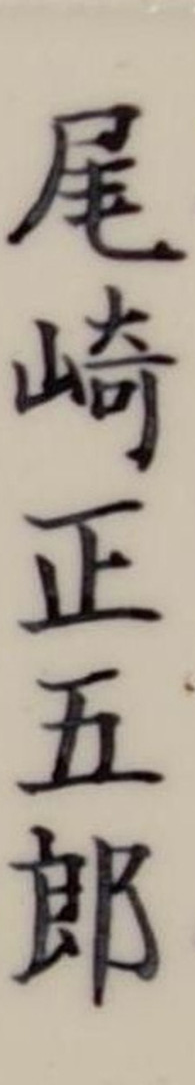尾崎正五郎
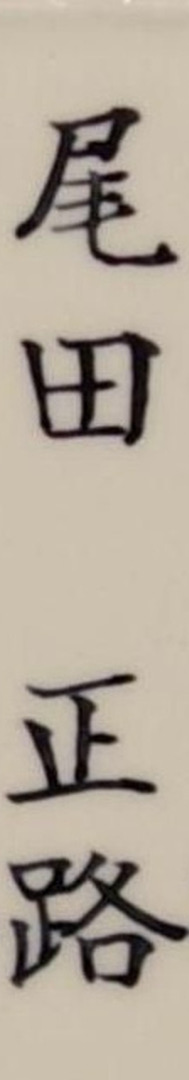尾田正路
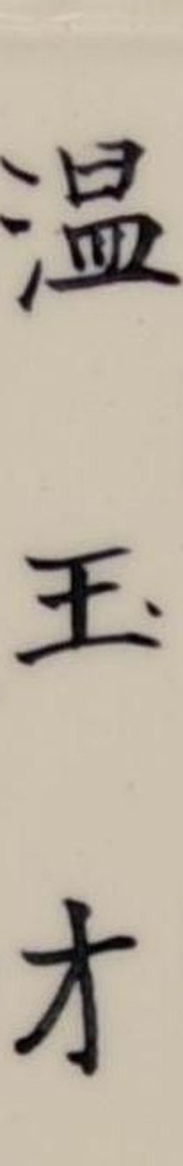温玉才
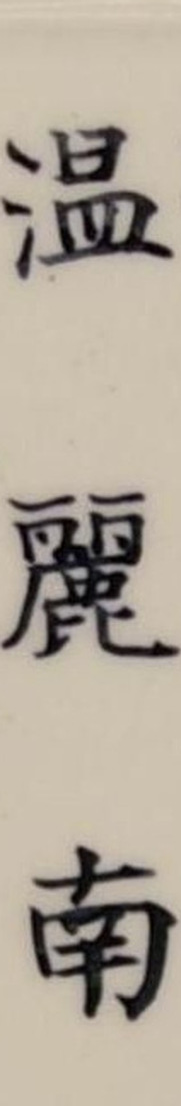温麗南
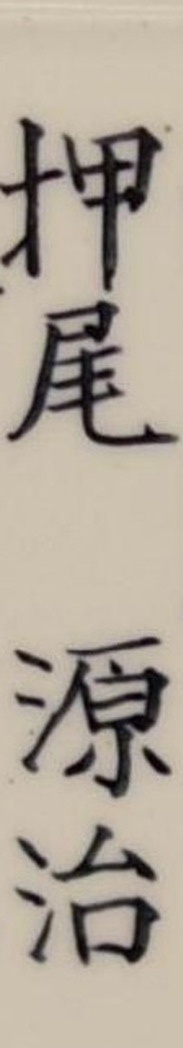押尾源治
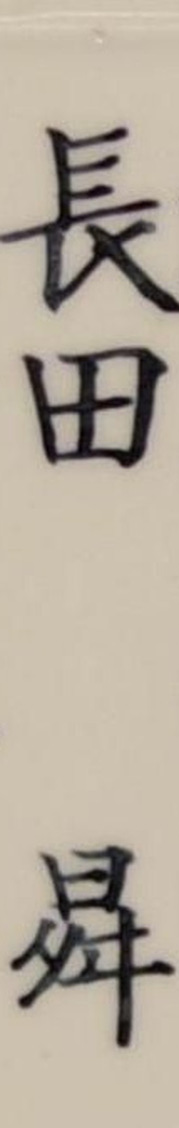長田昇
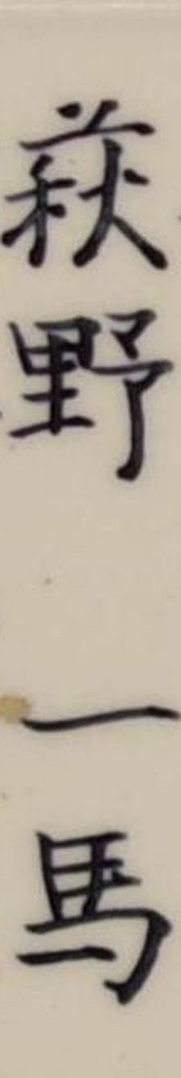萩野一馬
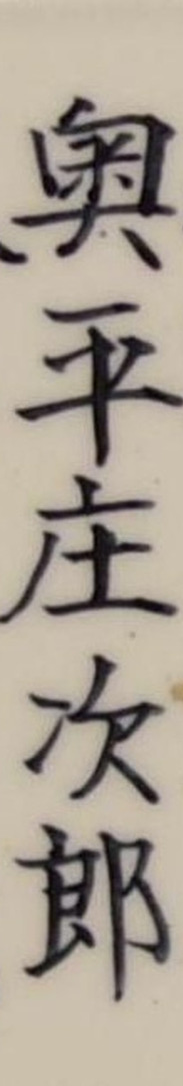奥平庄次郎
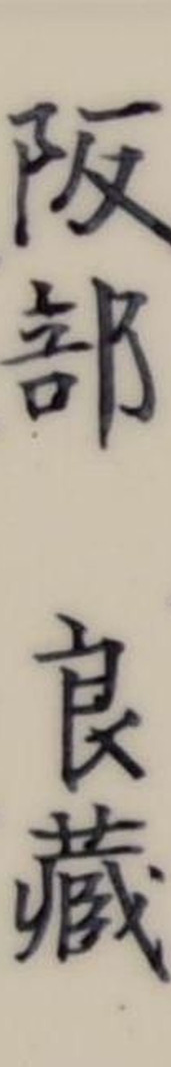阪部良蔵
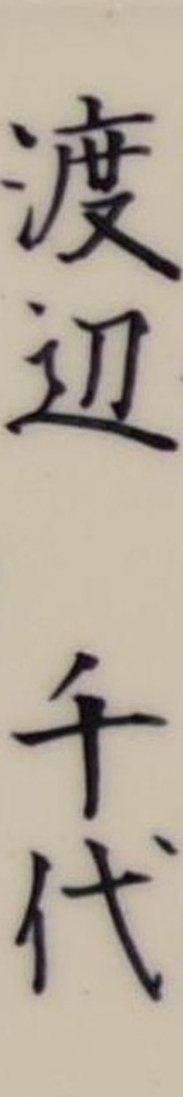渡辺千代
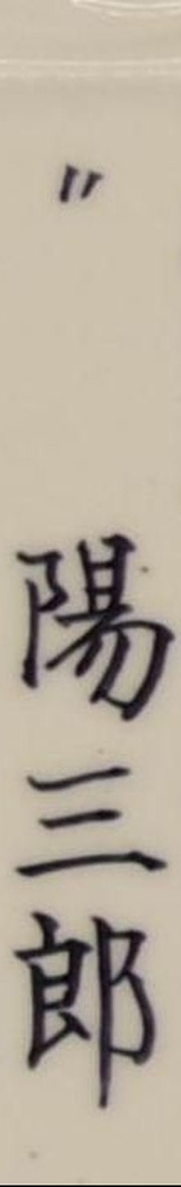陽三郎
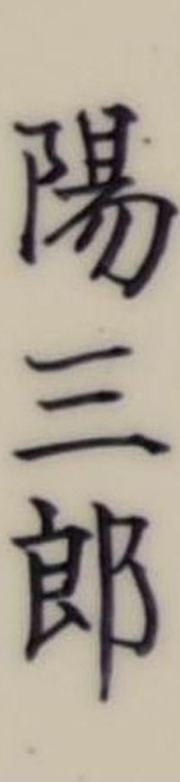陽三郎

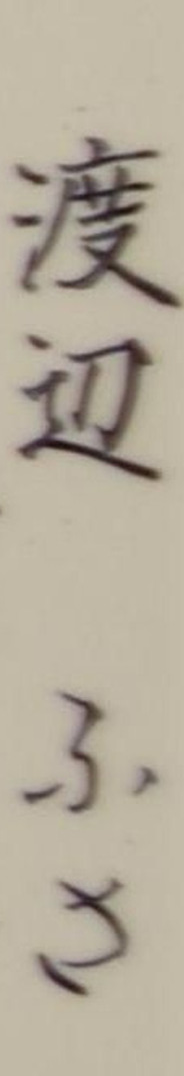渡辺ふさ
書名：E~L
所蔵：高野山金剛峯寺
